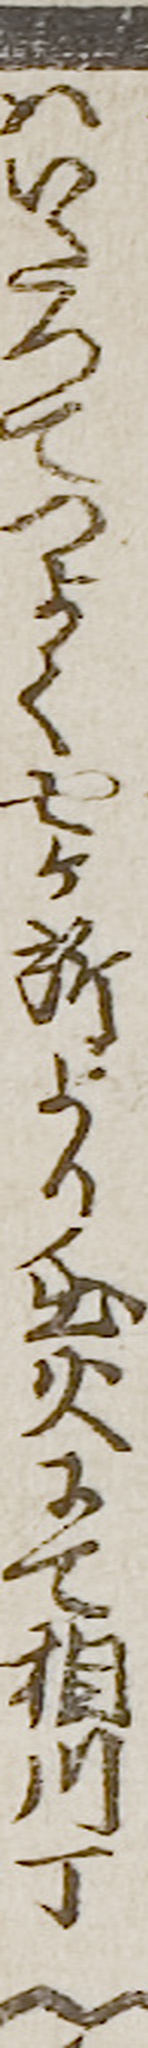はいたつてつよく七ケ所より出火にて相川丁
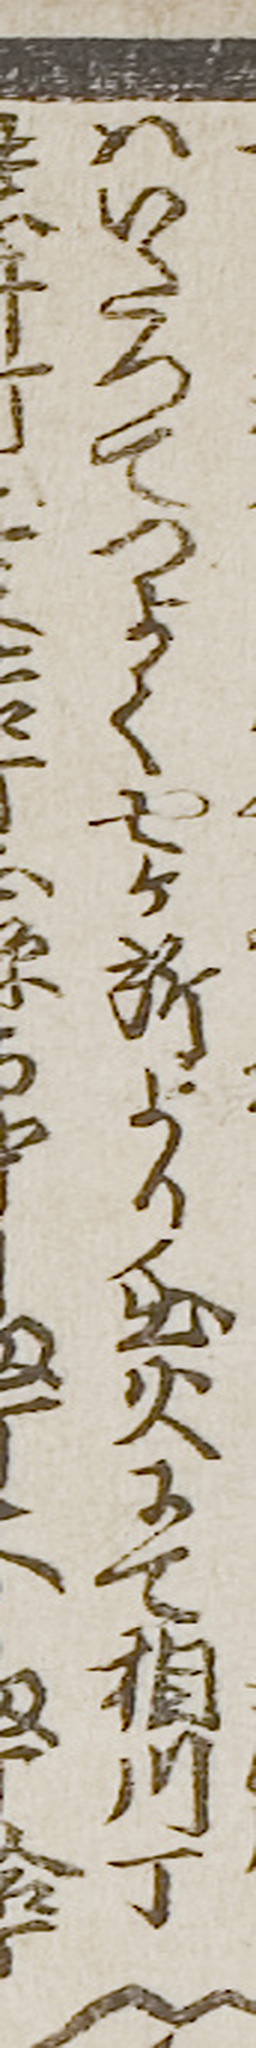熊井町とみ吉丁正源寺中しま丁大しま丁蛤丁
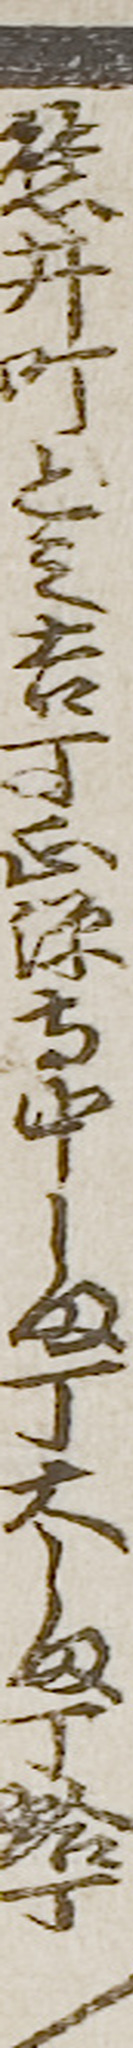熊井町とみ吉丁正源寺中しま丁大しま丁蛤丁
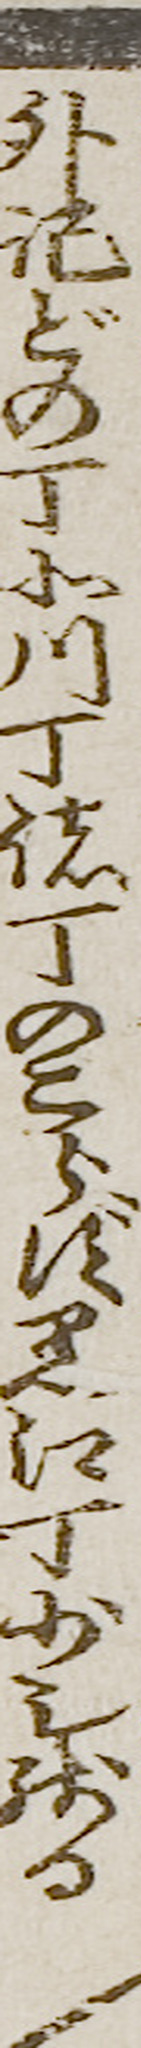外記どの丁北川丁諸丁のこらず黒江丁少シ残る
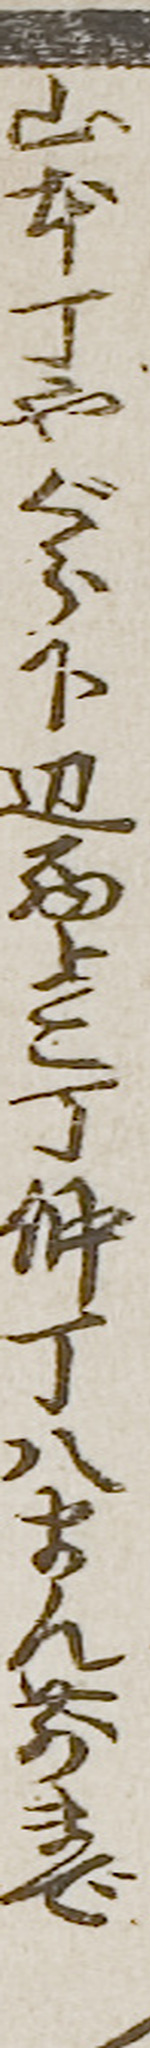山本丁やぐら下辺西よこ丁仲丁八まん前まで
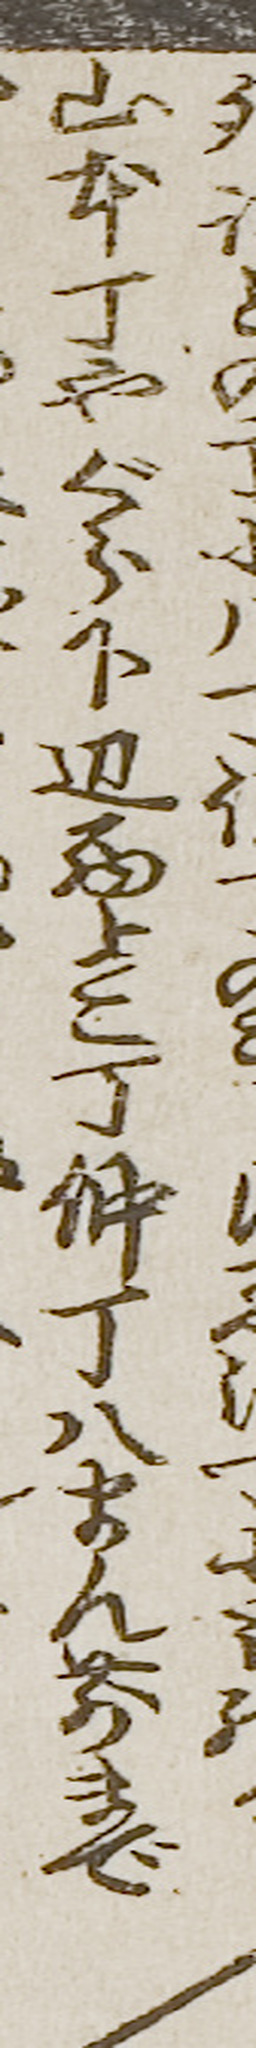山本丁やぐら下辺西よこ丁仲丁八まん前まで
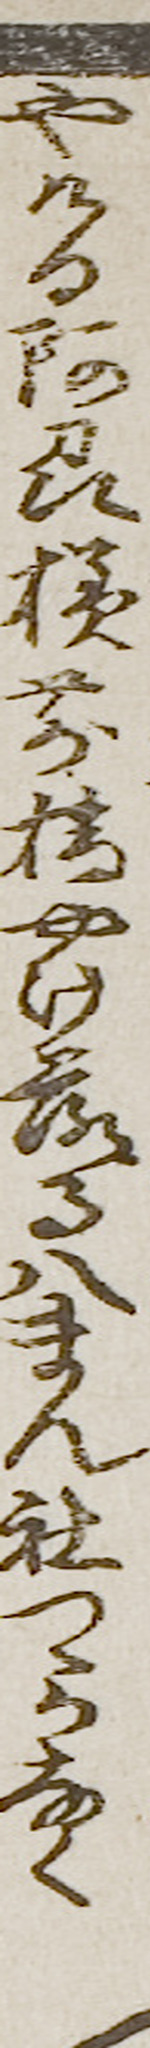やける阿州様前橋やけ落る八まん社つゝかなく
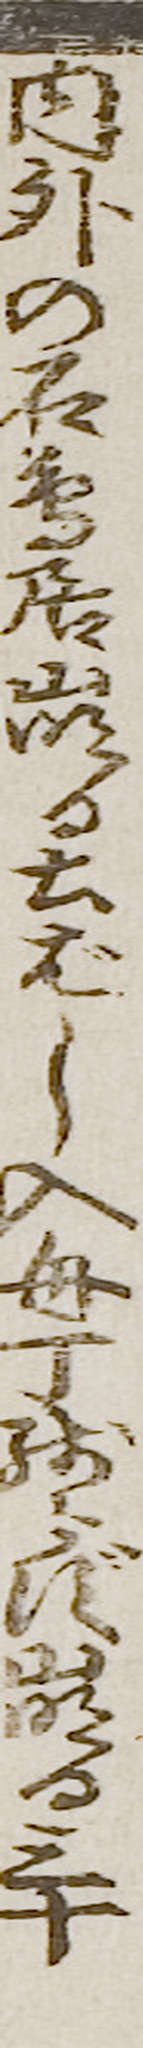内外の石鳥居崩る土ばし入舟丁残らず崩る三十
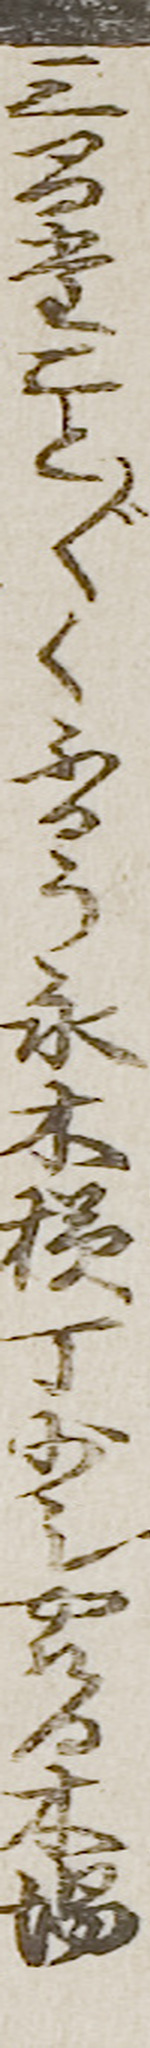三間堂こと〴〵くふるう永木様丁少シやける木場
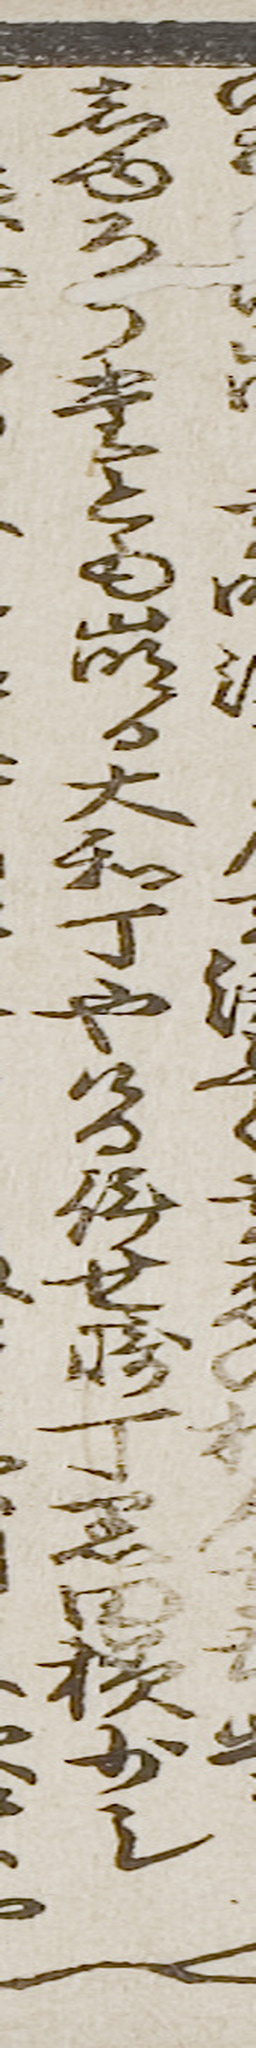しゆろう堂とも崩る大和丁やける伊せ崎丁黒田様少シ
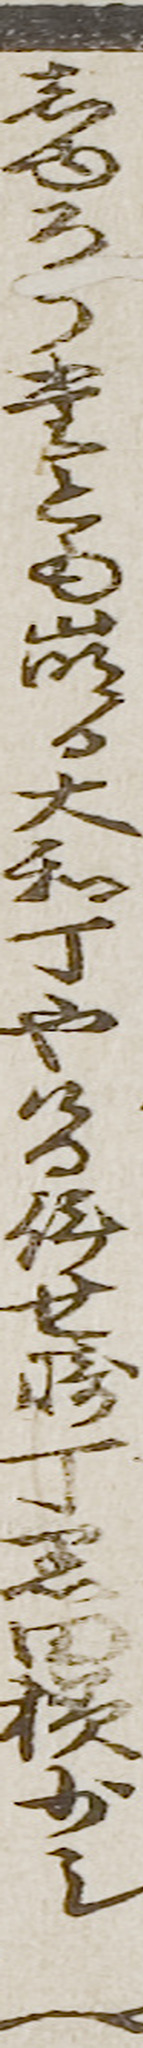しゆろう堂とも崩る大和丁やける伊せ崎丁黒田様少シ
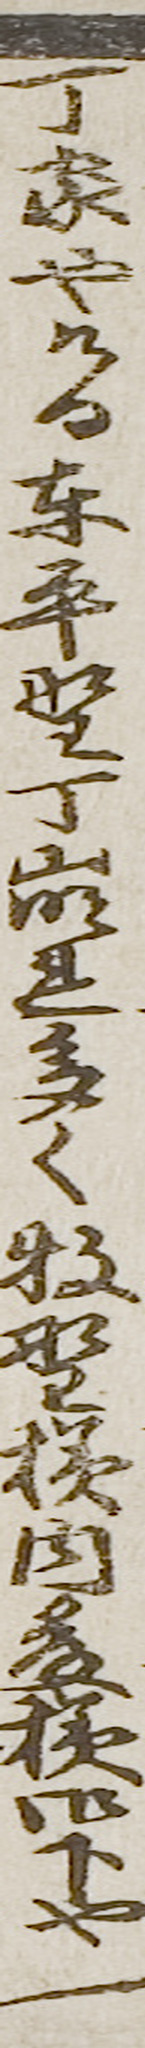丁家やける東平野丁崩れ多く牧野様内藤様御下や
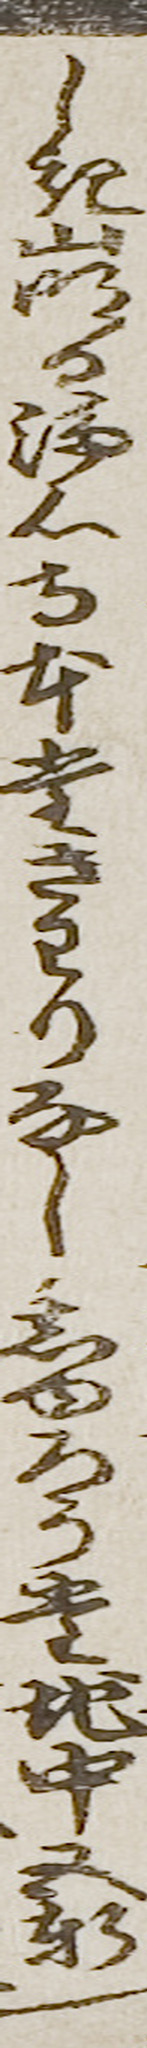しき崩る浄心寺本堂さわりなししゆろう堂地中五軒
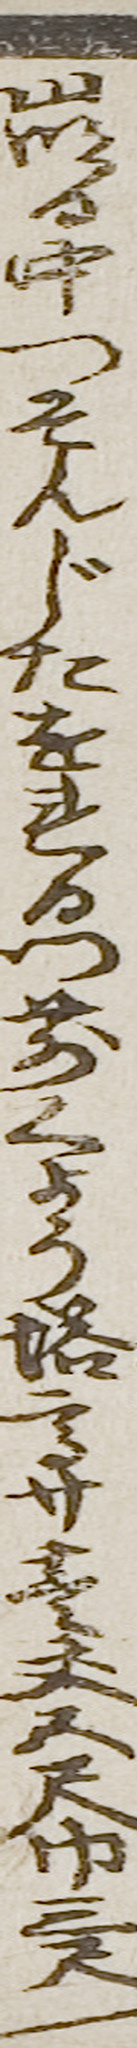崩る中門そんじたをれる門前くよう塔高サ壱丈五尺巾三尺
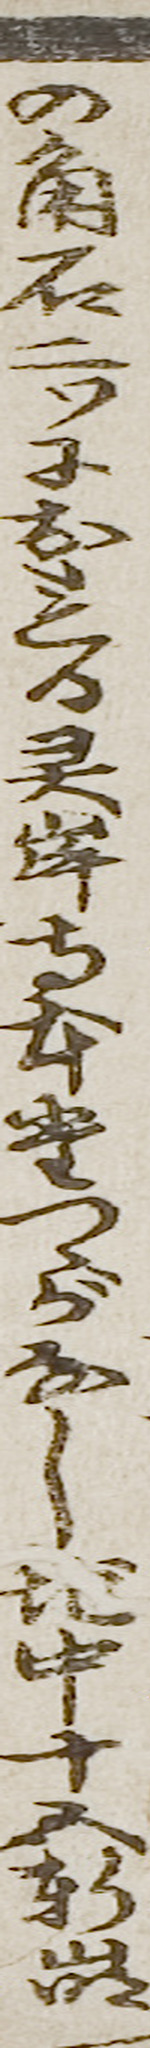の角石二ツにおれる霊岸寺本堂つゝがなし地中十五軒崩
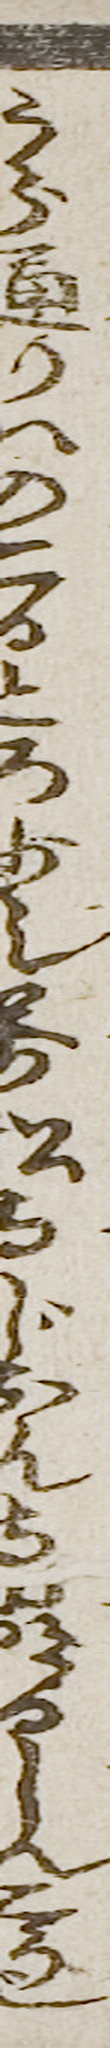うら通りはのこるとろ少シ茶松寺じおん寺崩るしんこうじ
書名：安政改正泰平盤石図会
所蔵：東京大学総合図書館 General Library in the University of Tokyo, JAPAN
